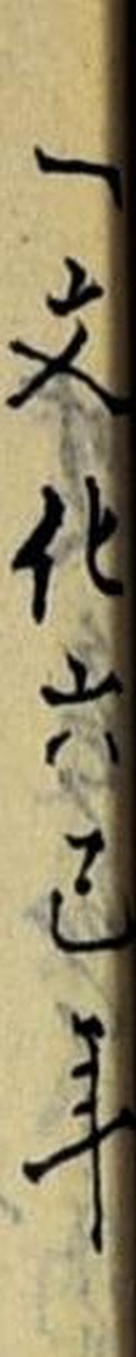一文化六巳年
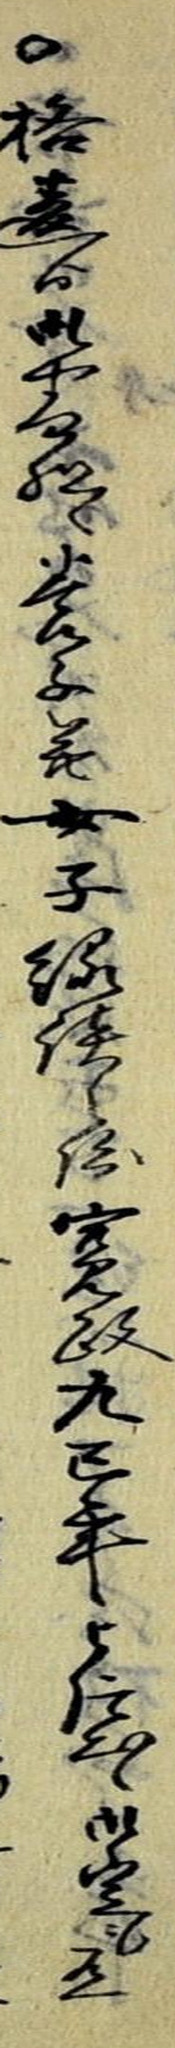○格違ゟ御番組へ養子并女子縁談之儀寛政九巳年被仰出候御定も有
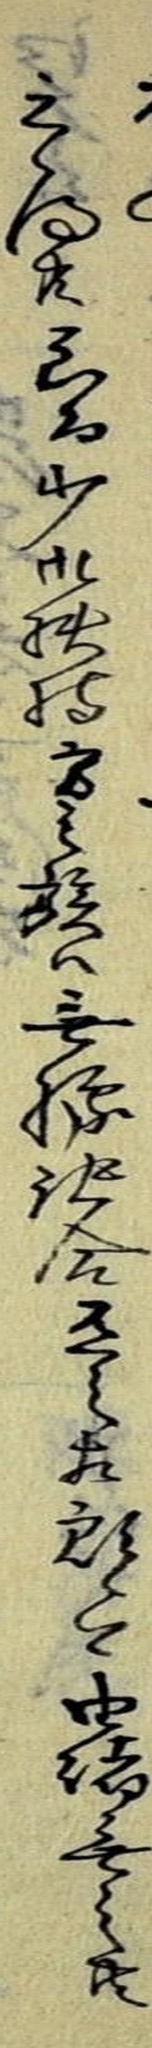之候得共至而少御扶持方之族は無拠決合有之相願候はヽ由緒無之共
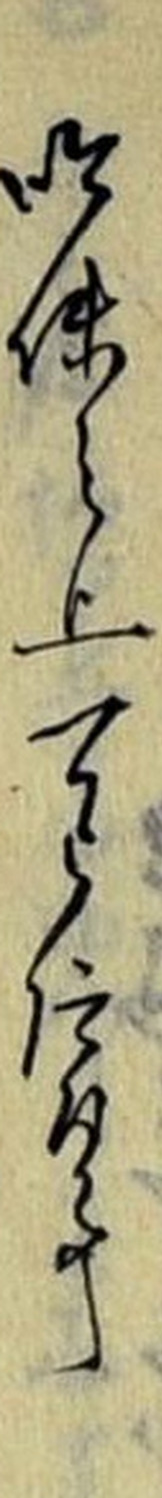吟味之上可被仰付事
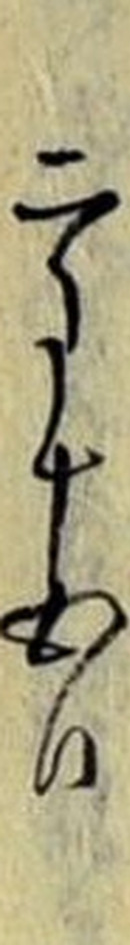二月十五日
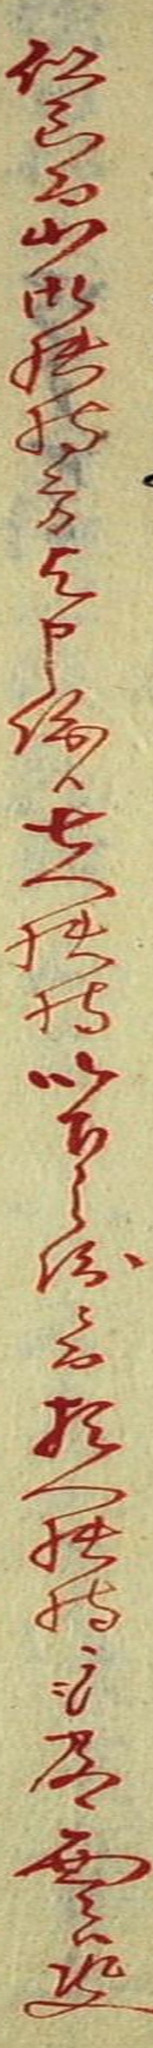但至而少御扶持方と申儀は七人扶持以可之儀に而拾人扶持にも及候面々は決
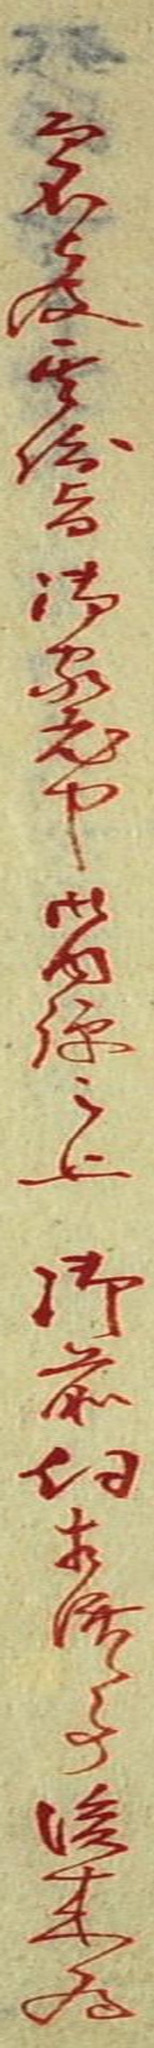而不被及其儀旨御家老中御内評之上御前伺相済候事後來為
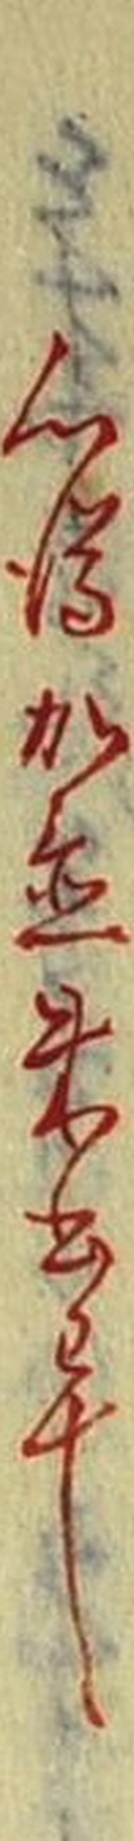心得加置朱書畢
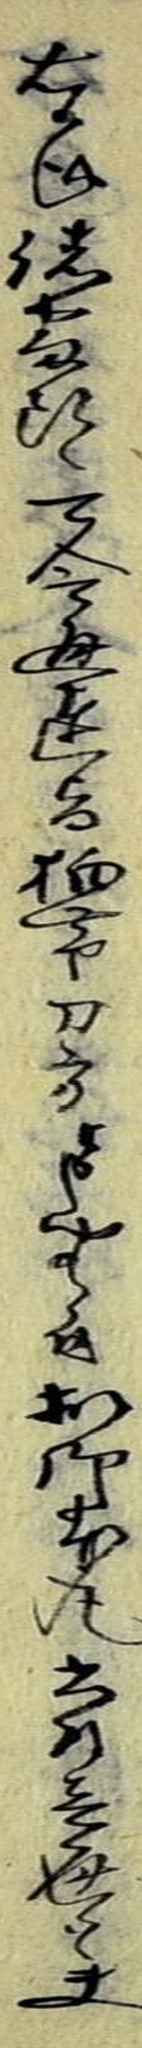右之趣諸番頭へ可令通達旨狛帯刀方被申候に付於御本丸書付壱通つヽ夫
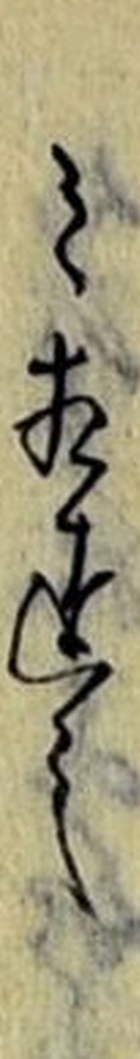々相達之
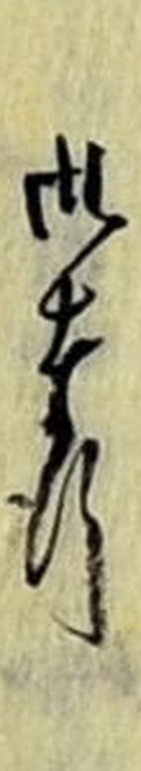御奉行
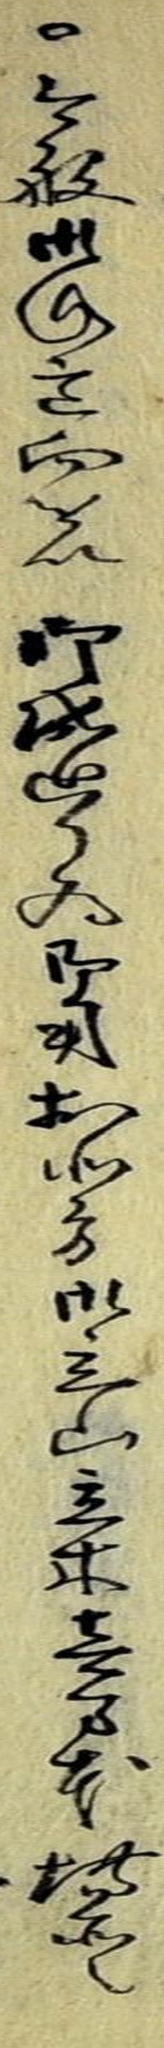○今般御趣意向を以御城廻り為御用於北方御立山立木壱万本場所之
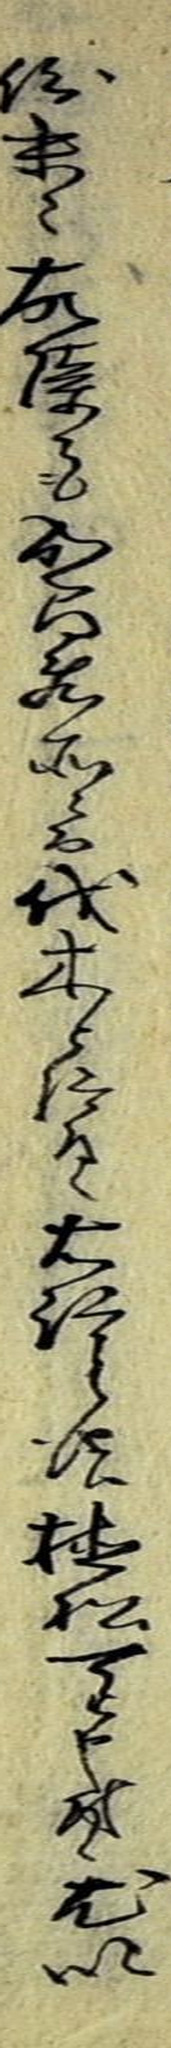儀末々故障にも成間敷所に而伐木被仰付候右跡之儀は植松可被申付候尤以
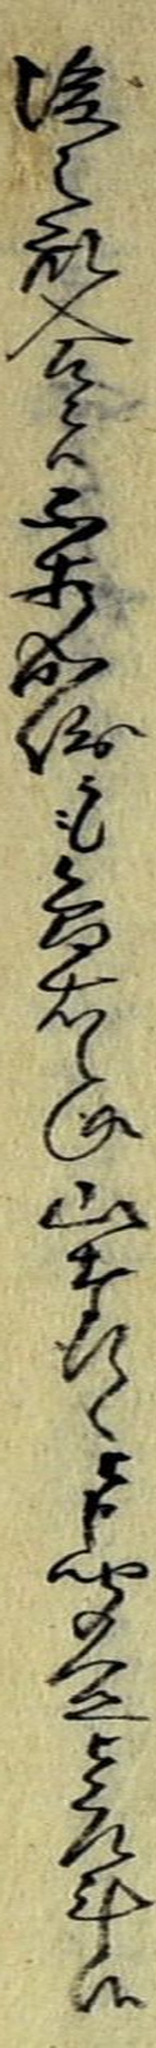後之形合には不相成儀にも候間右之趣山奉行へ被申聞宜被取斗候

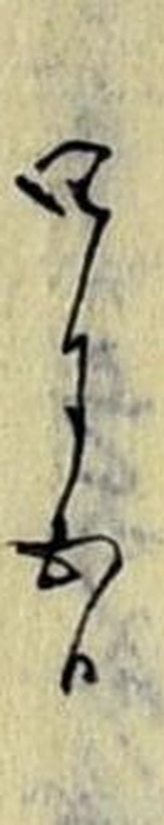四月五日
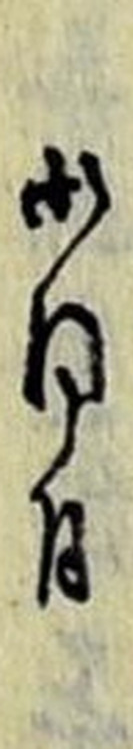御目付
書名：命令之部 四
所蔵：福井県文書館 Fukui Prefectural Archives
